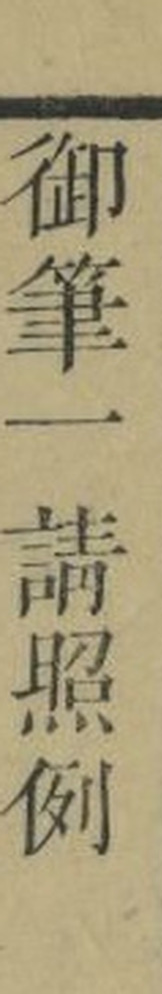御筆一請照例
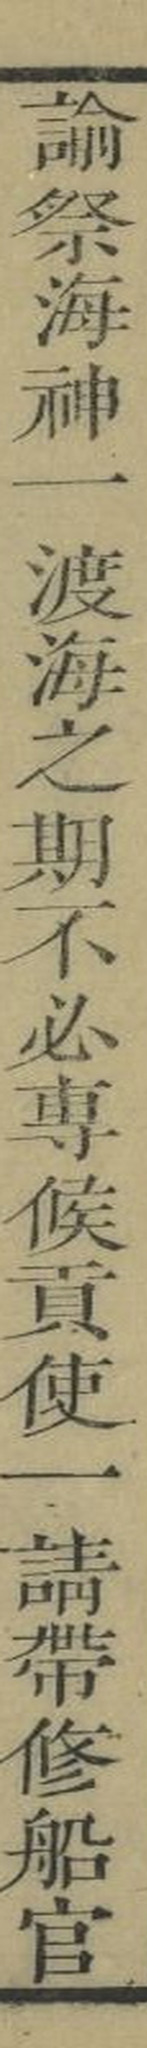諭祭海神一渡海之期不必専候貢使一請帯修船官
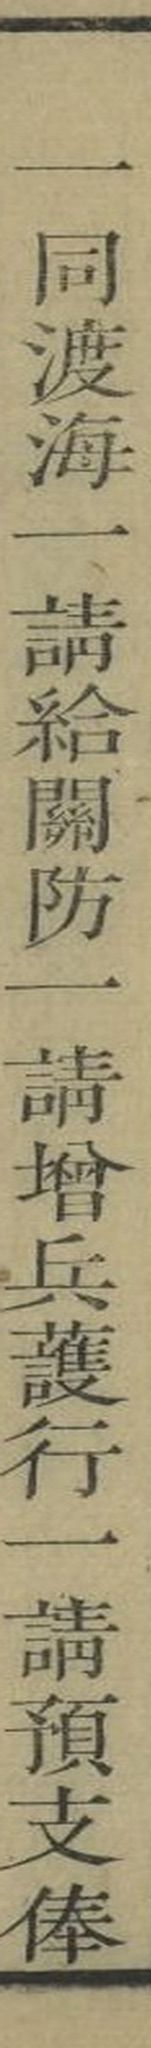一同渡海一請給関防一請増兵護行一請預支俸
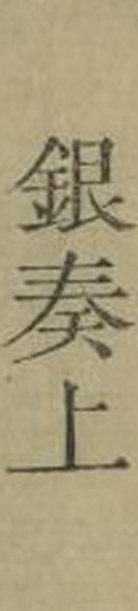銀奏上
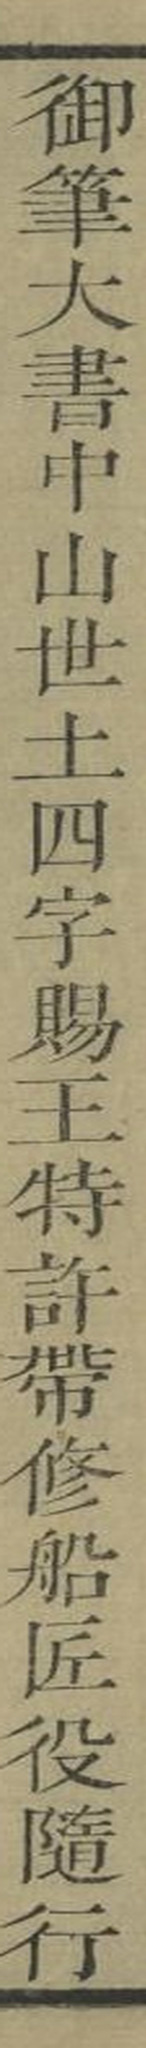御筆大書中山世土四字賜王特許帯修船匠役随行
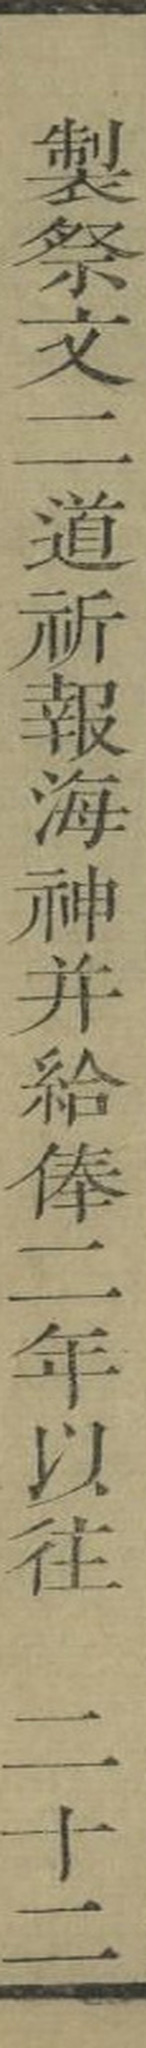製祭文二道祈報海神幷給俸二年以往二十二
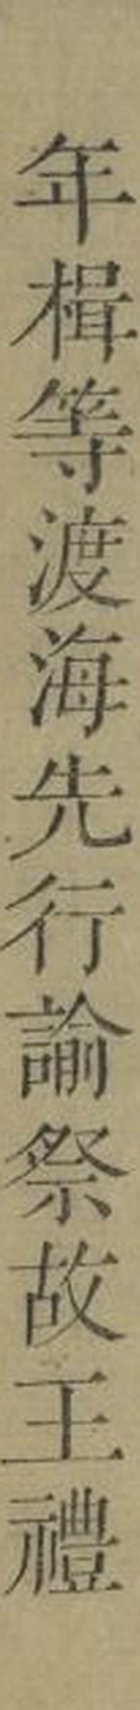年楫等渡海先行諭祭故王礼

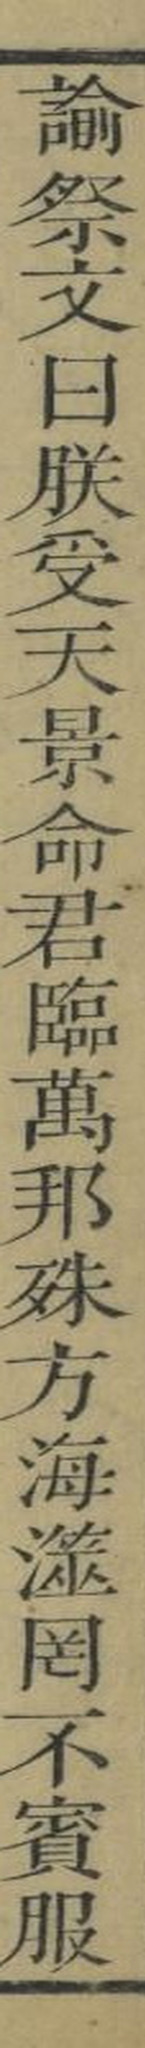諭祭文曰朕受天景命君臨万邦殊方海澨罔不賓服
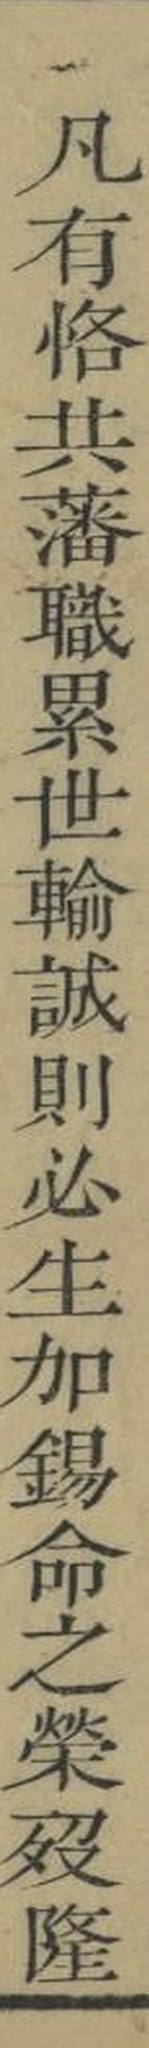凡有恪共藩職累世輸誠則必生加錫命之栄歿隆
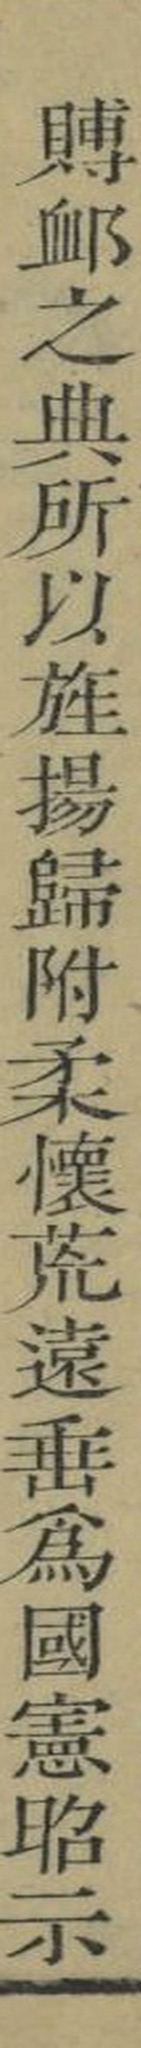賻恤之典所以旌揚帰附柔懐荒遠垂為国憲昭示
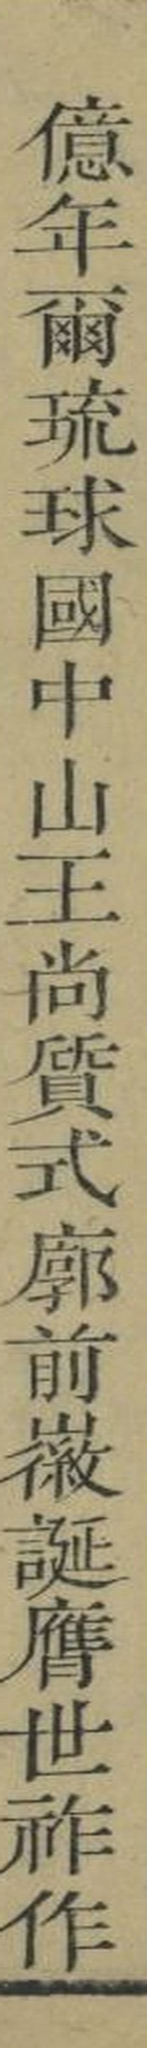億年爾琉球国中山王尚質式廓前徽誕膺世祚作
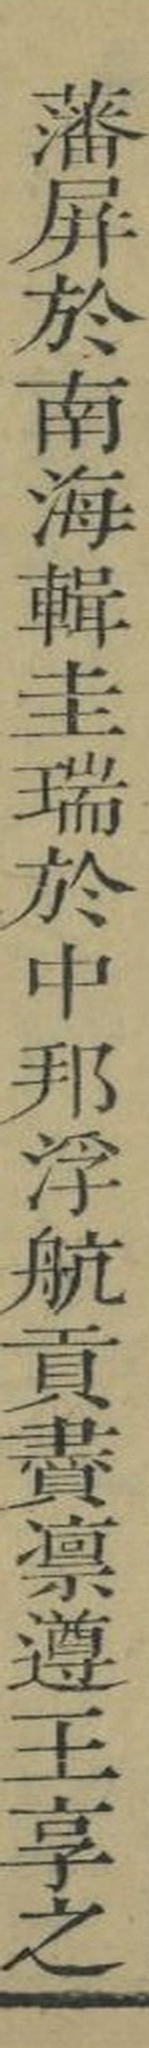藩屏於南海輯圭瑞於中邦浮航貢賮凜遵王享之
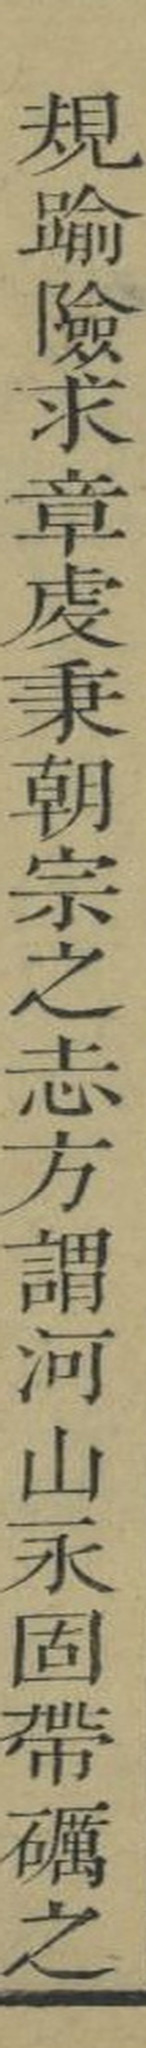規踰険求章虔秉朝宗之志方謂河山永固帯礪之
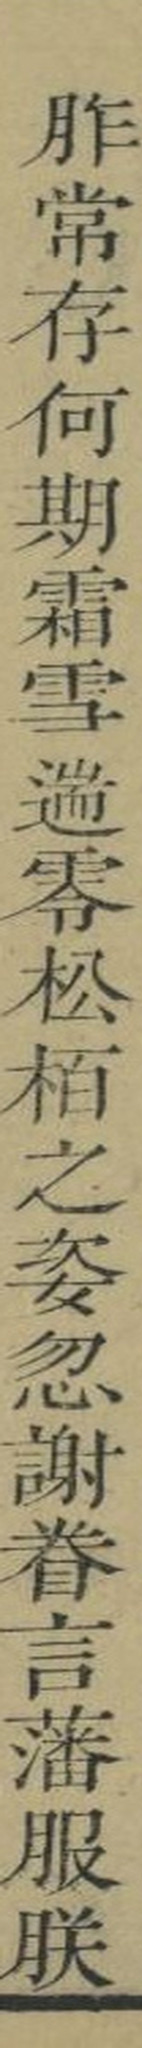胙常存何期霜雪遄零松柏之姿忽謝眷言藩服朕
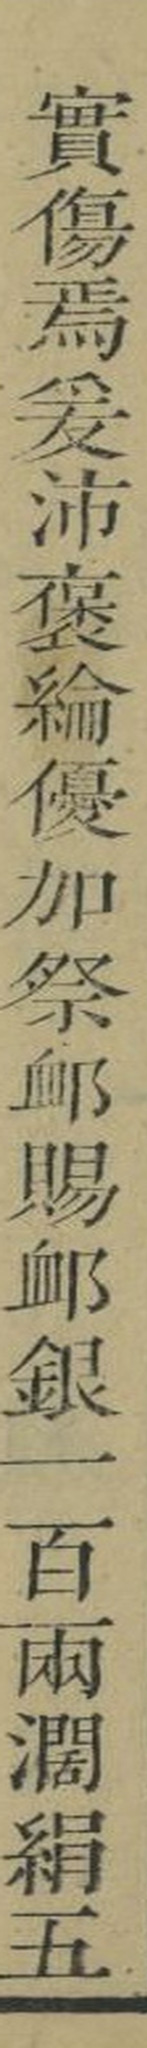実傷焉爰沛褒綸優加祭恤賜恤銀一百両濶絹五
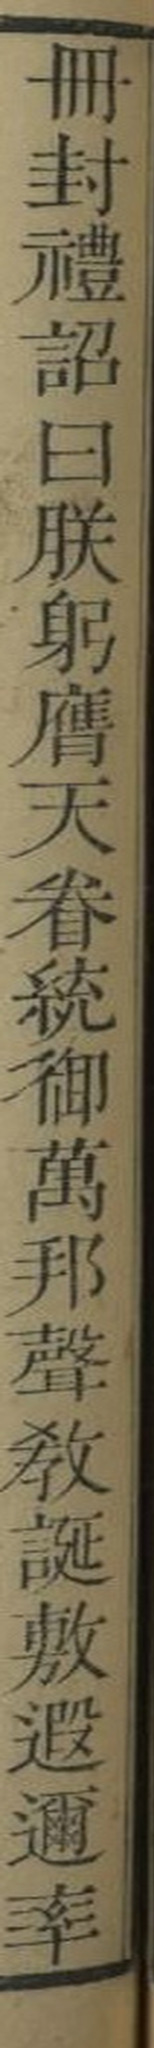冊封礼詔曰朕躬膺天眷統御万邦声教誕敷遐邇率
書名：中山伝信録 巻三
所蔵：University of the Ryukyus Library
